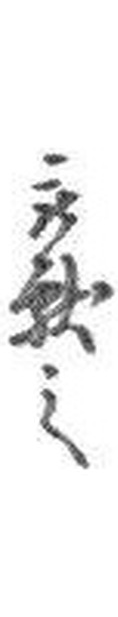被献之
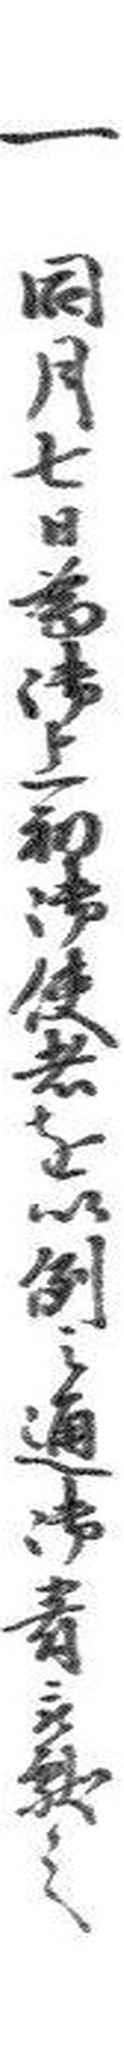一同月七日為御上初御使者を以例之通御肴被献之
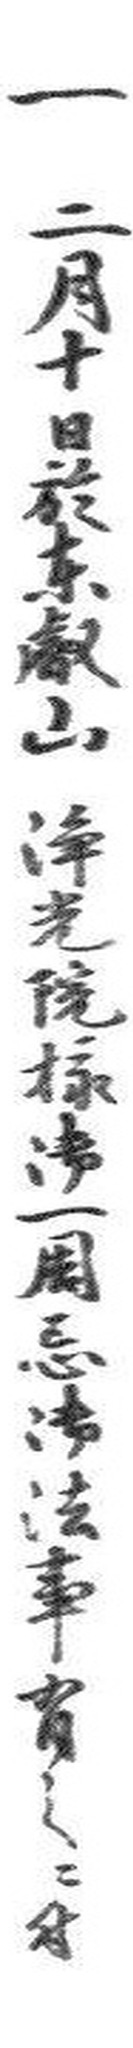一二月十日於東叡山浄光院様御一周忌御法事有之ニ付

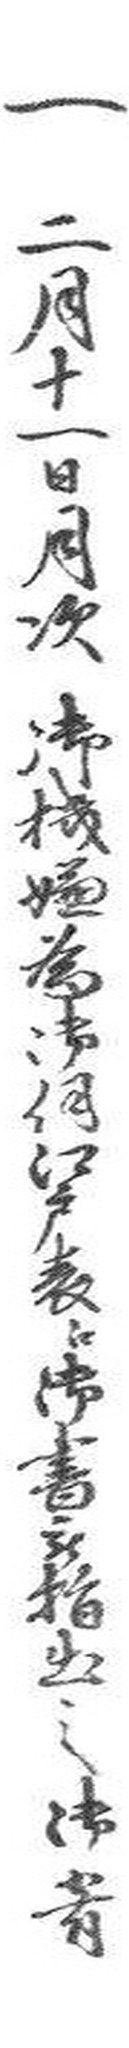一二月十一日月次御機嫌為御伺江戸表江御書被指出之御肴
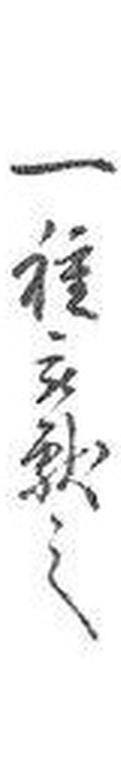一種被献之
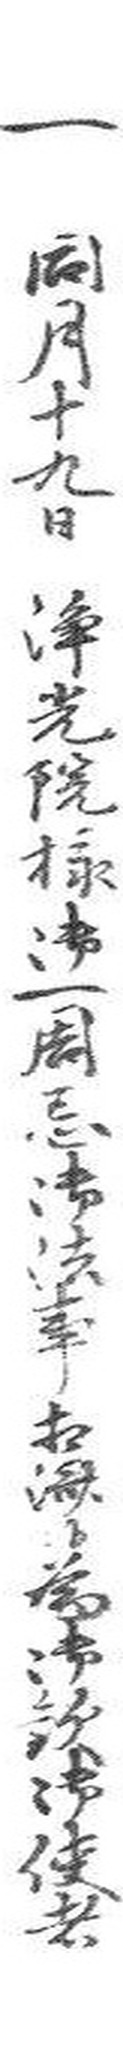一同月十九日浄光院様御一周忌御法事相済候為御歓御使者
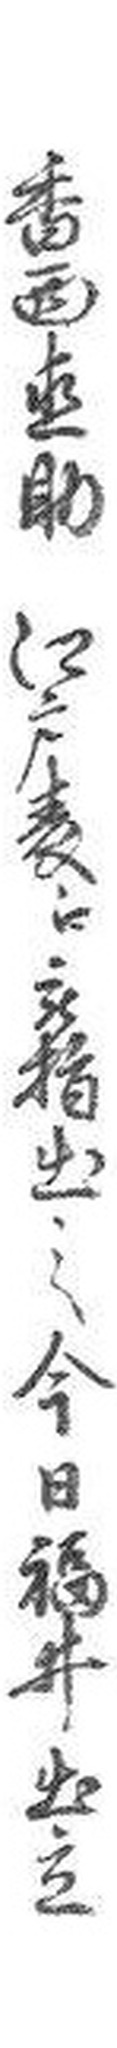香西直助江戸表江被指出之今日福井出立
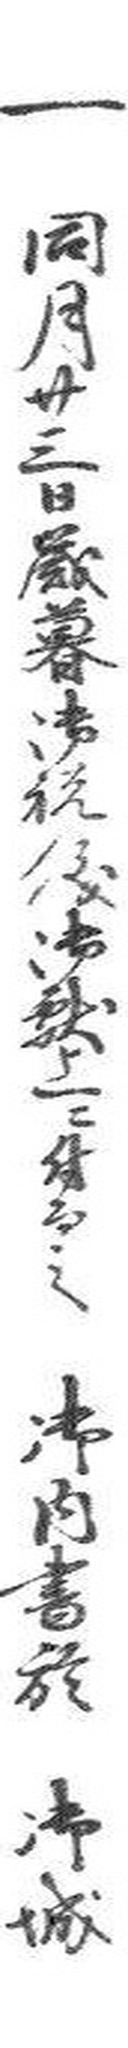一同月廿三日歳暮御祝儀御献上ニ付而之御内書於御城
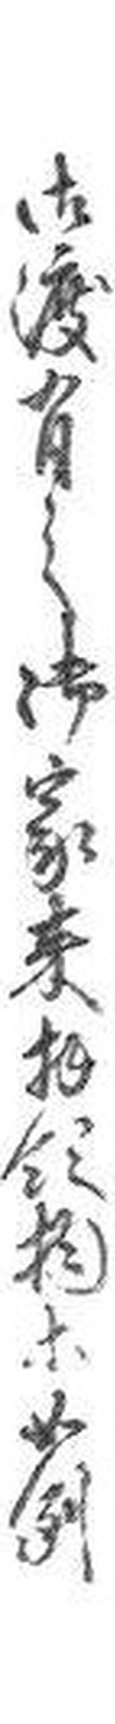御渡有之御家来拝領物等如例
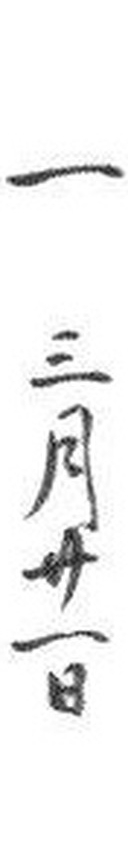一三月廿一日
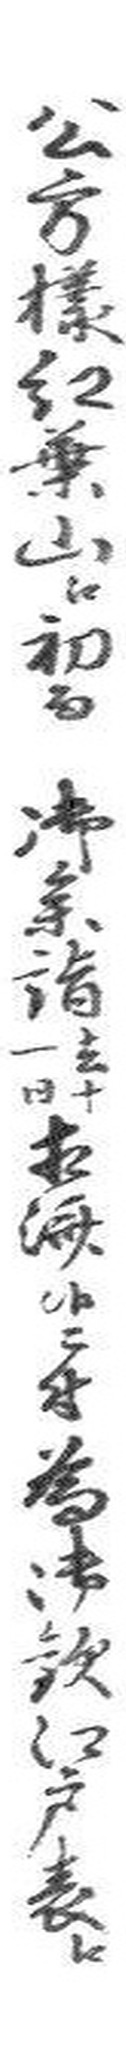公方様紅葉山江初而御参詣去十一日相済候ニ付為御歓江戸表江
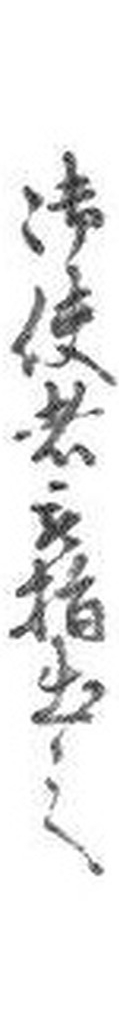御使者被指出之
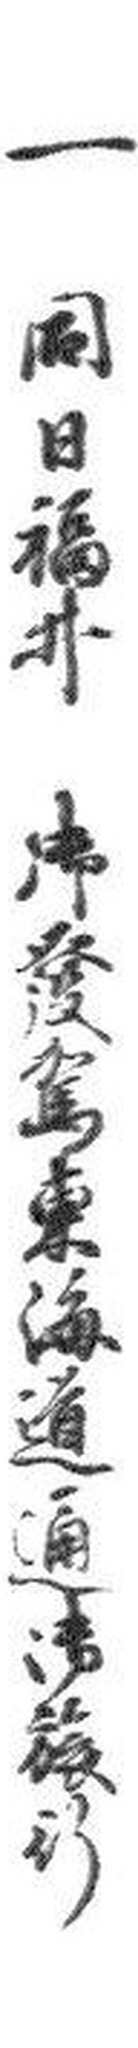一同日福井御発駕東海道通御旅行
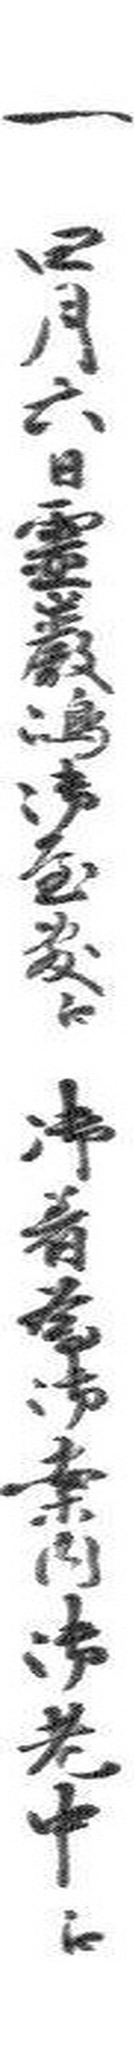一四月六日霊巖島御屋敷江御着為御案内御老中江
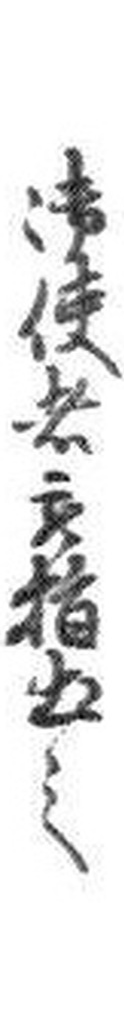御使者被指出之
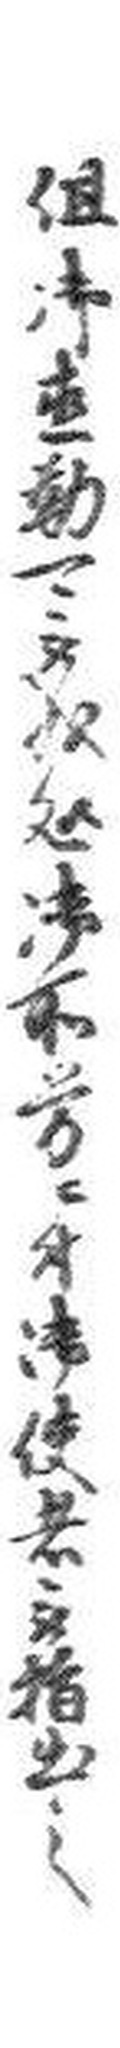但御直勤可被成処御所労ニ付御使者被指出之
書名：家譜 二十五 吉品公 従宝永六年到同七年
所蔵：福井県文書館 Fukui Prefectural Archives
